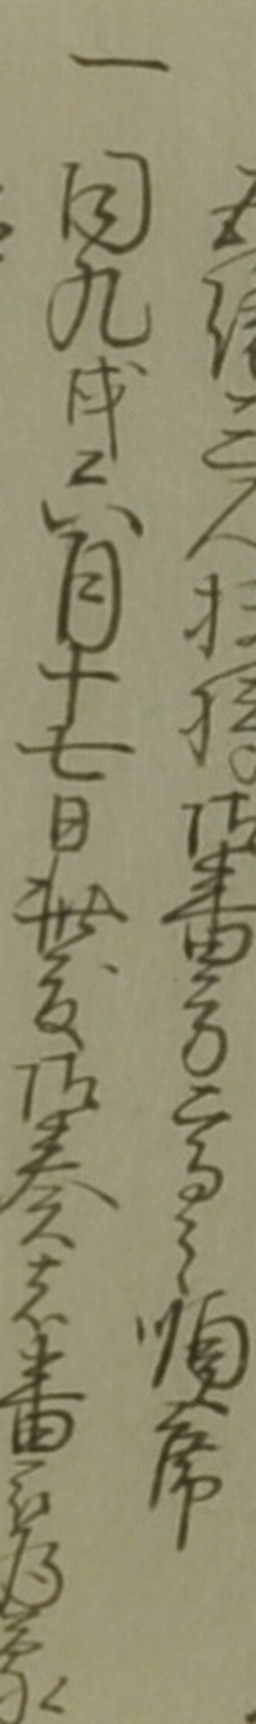一同九戊六月十七日此度御奏者番被為蒙
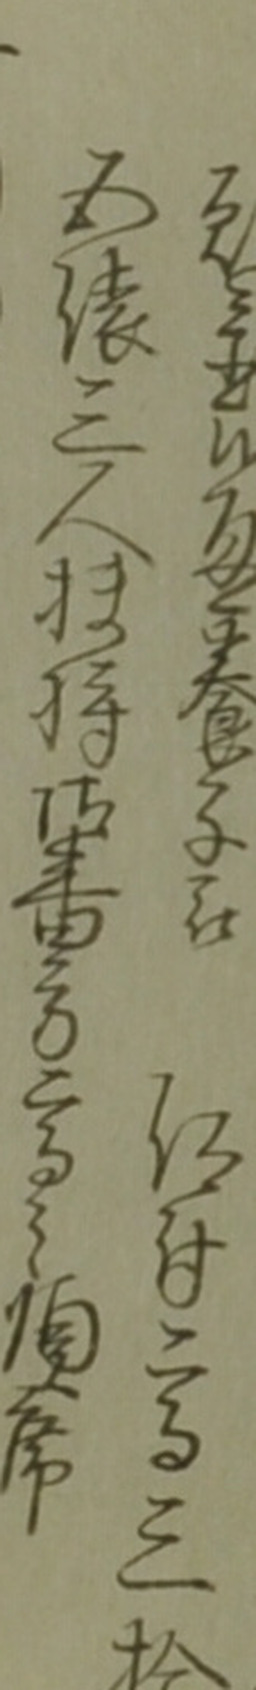五俵三人扶持御番方高之順序
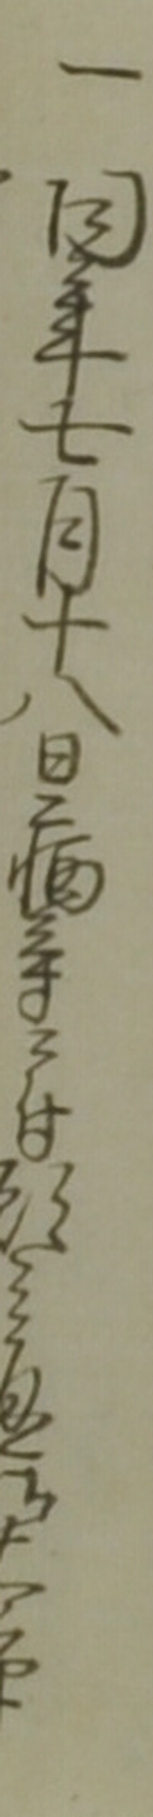一同年七月十八日病気ニ付願之通御右筆
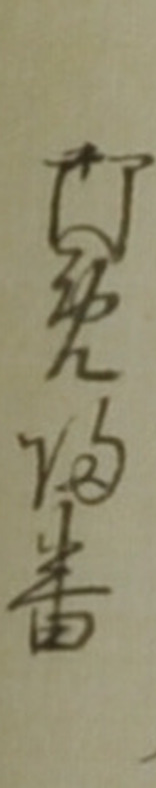御免帰番

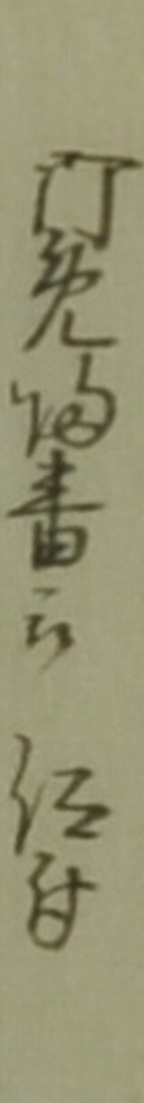御免帰番被仰付
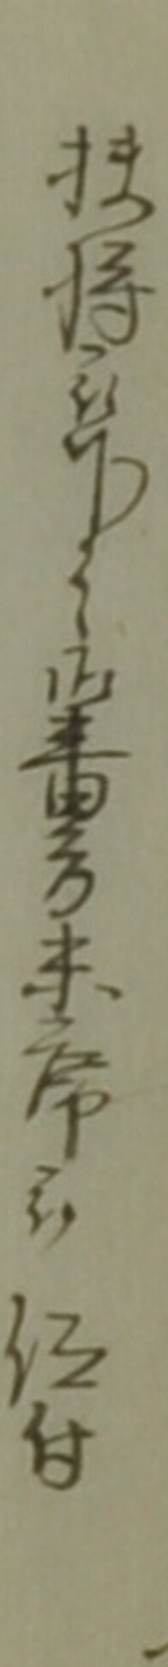扶持被下之御番方末席被仰付
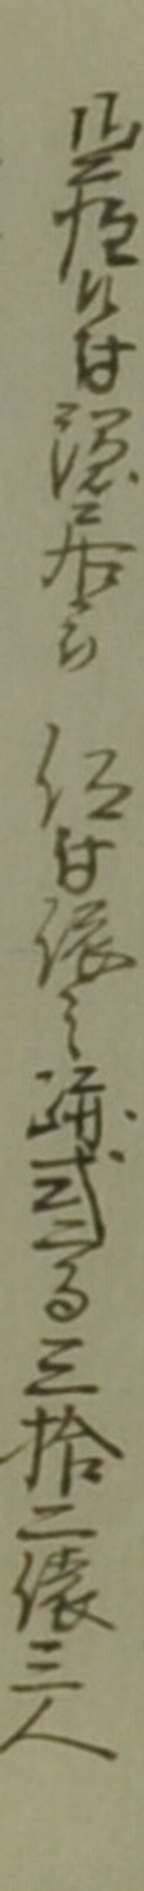御座候付隠居被仰付依之跡式高三拾ニ俵三人
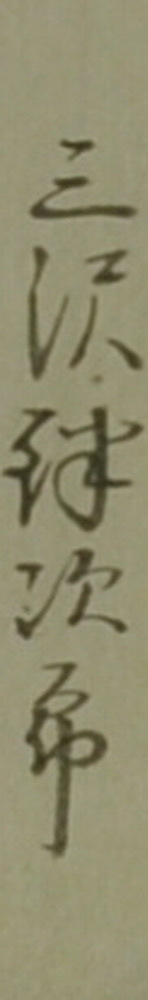三沢鉄次郎
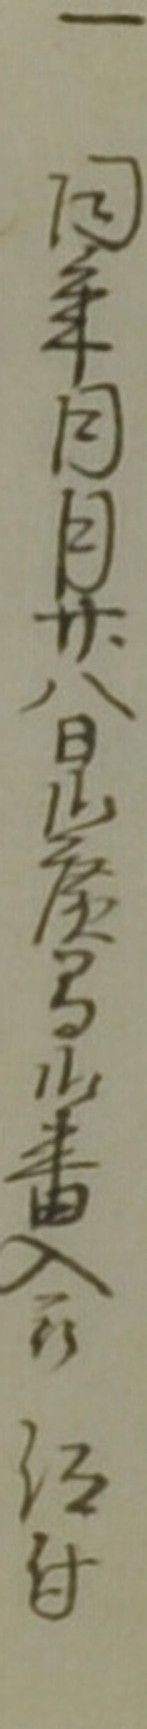一同年同月廿八日御広間御番入被仰付
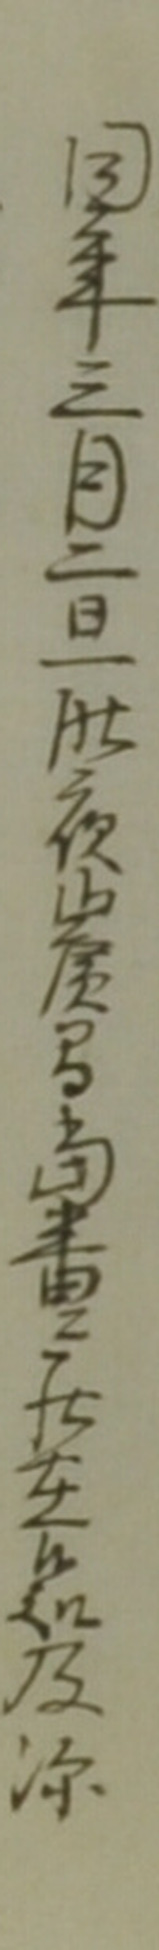一同年三月二日一昨夜御広間当番二罷在候處及深
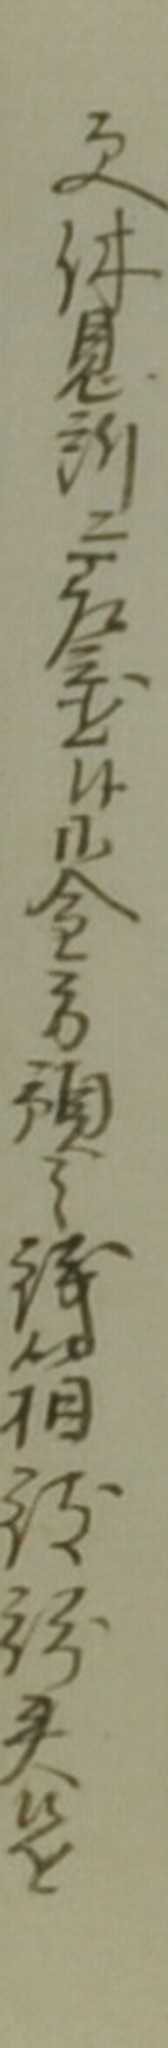更休息所ニ差置候御金方預之銭箱致紛失候を

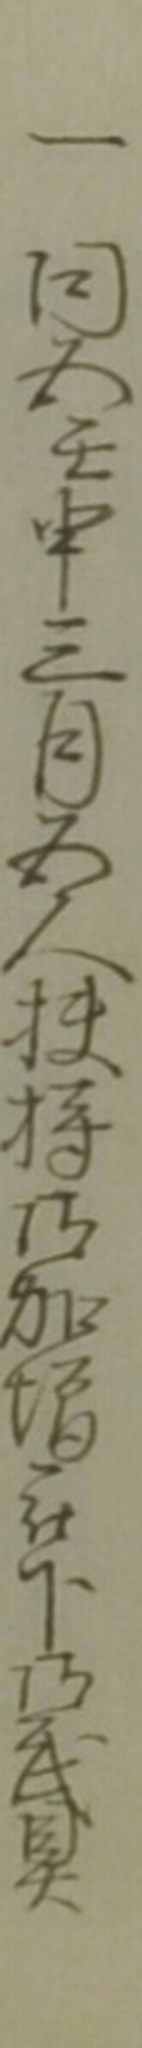一同五壬申三月五人扶持御加増被下御武具
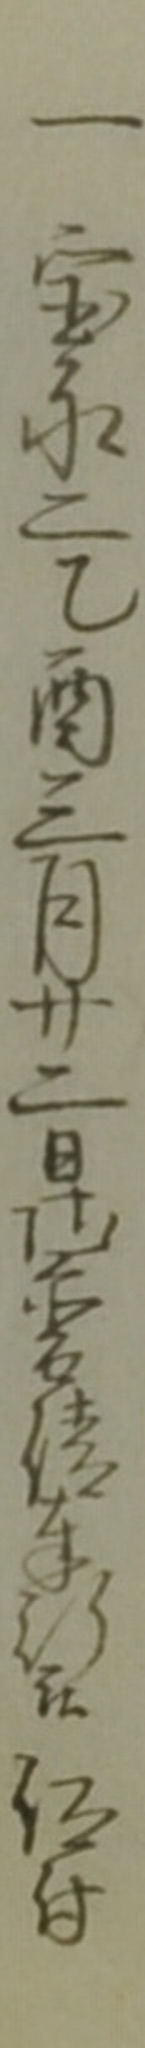一宝永二乙酉三月廿二日御普請奉行被仰付
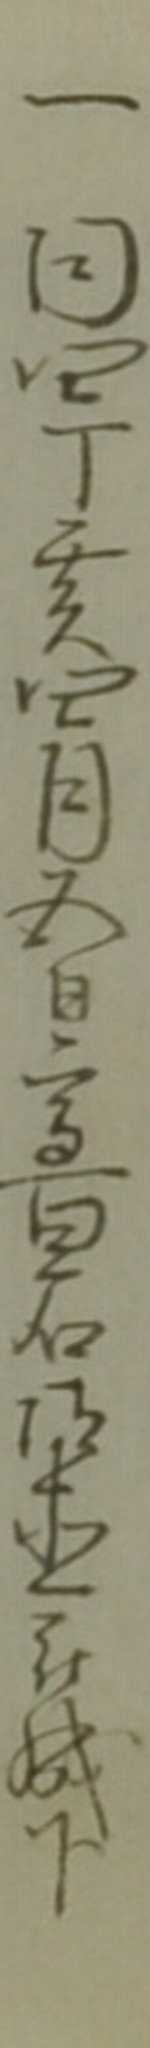一同四丁亥四月五日高百石御直被成下
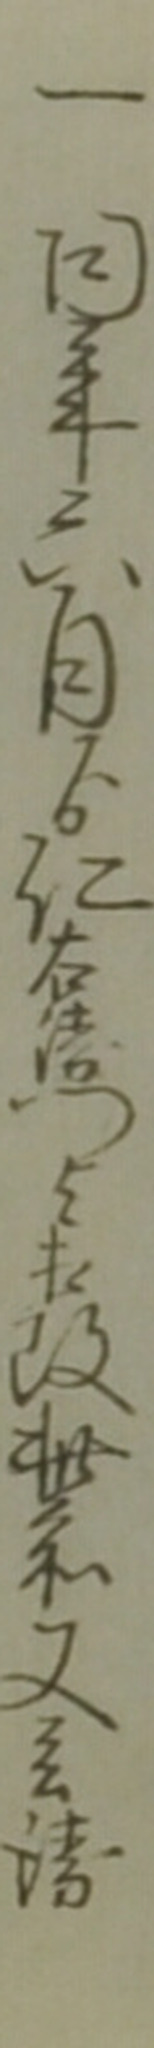一同年六月ゟ仁右衛門与相改此前又兵衛
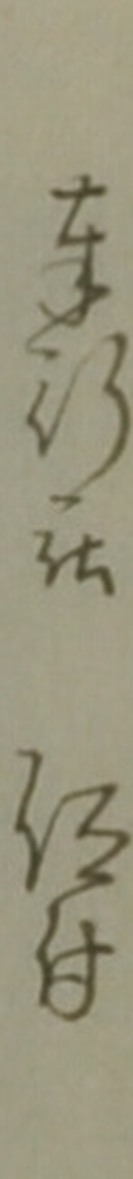奉行被仰付
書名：給人諸士勤仕録（三）
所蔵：伊那市立高遠町図書館・合同会社AMANE
